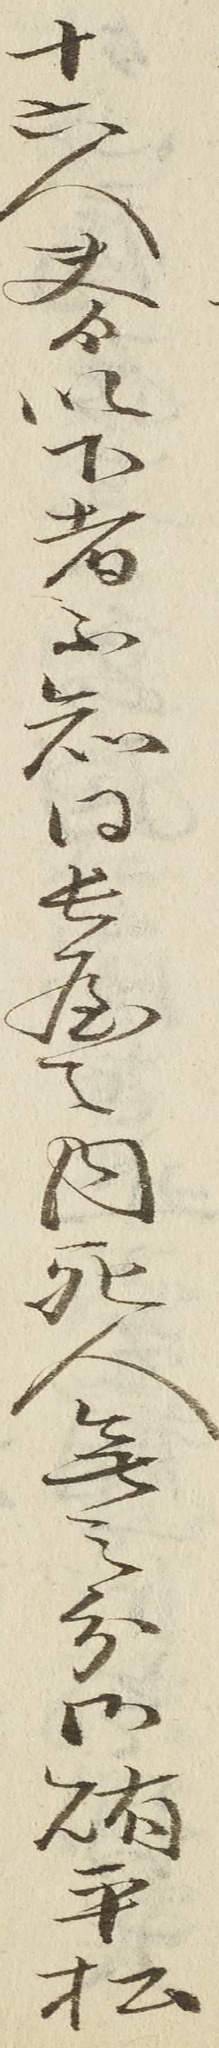十六人夫ゟ以下は不知同長屋之内死人無之分御賄平松
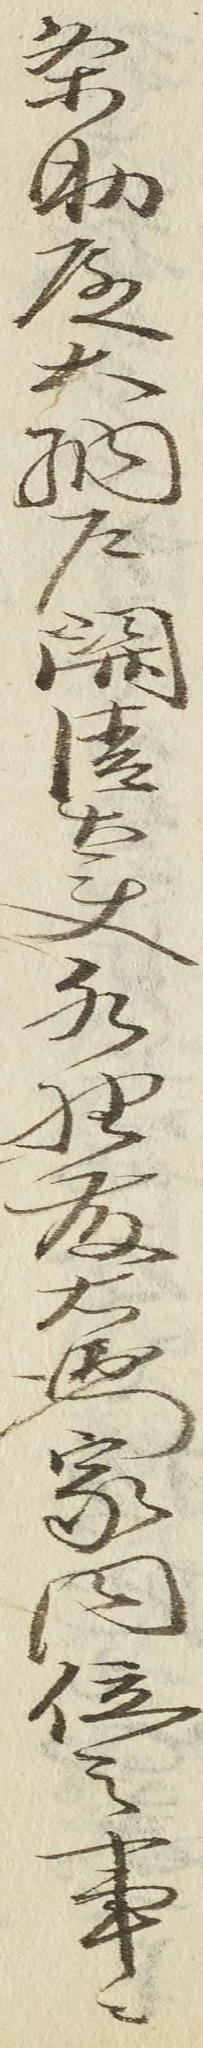条介殿大納戸関清太夫水野藤右衛門家内位之事二
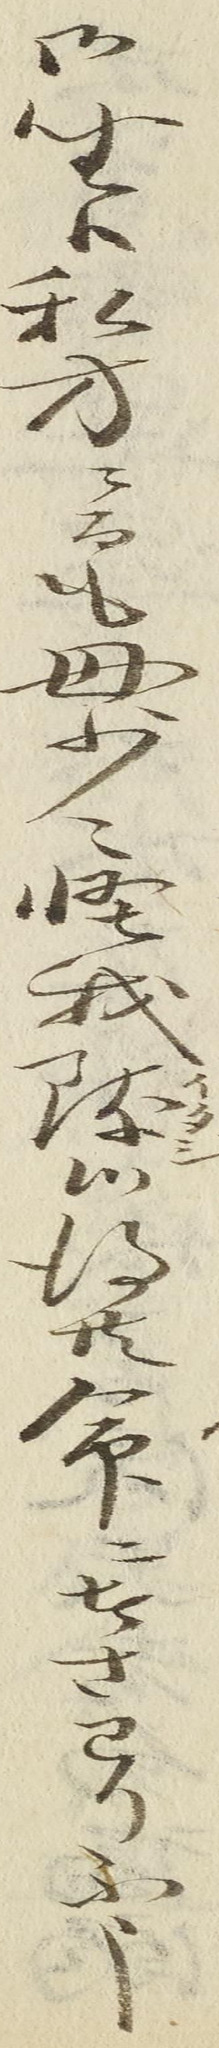御坐候私方二而も母少々怪我致候得共命二はさわり不申
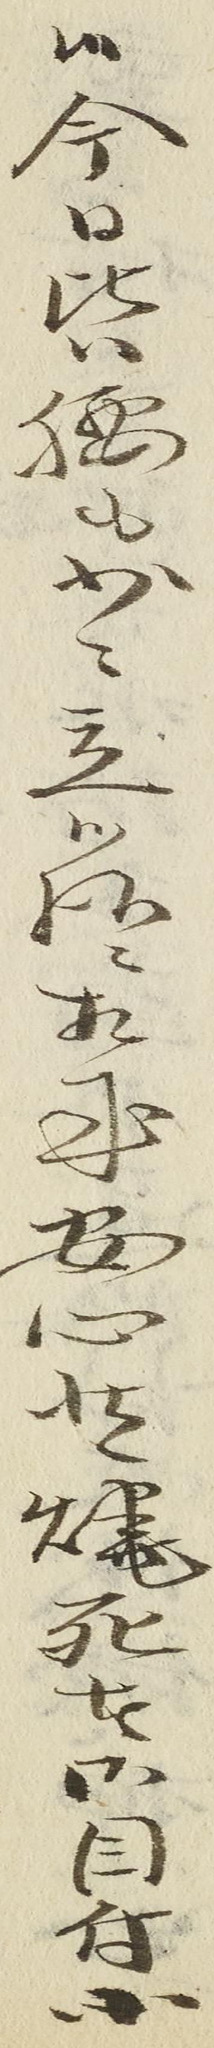候今日比ハ腰も少々立候様二相成安心仕候焼失死は御目付小
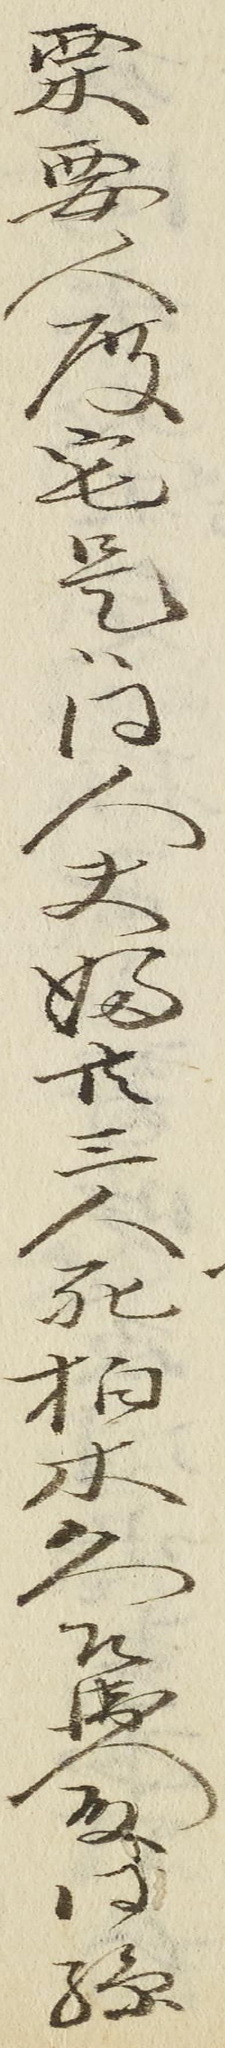栗要人殿宅是ハ同人夫婦共三人死柏木久左衛門殿同孫
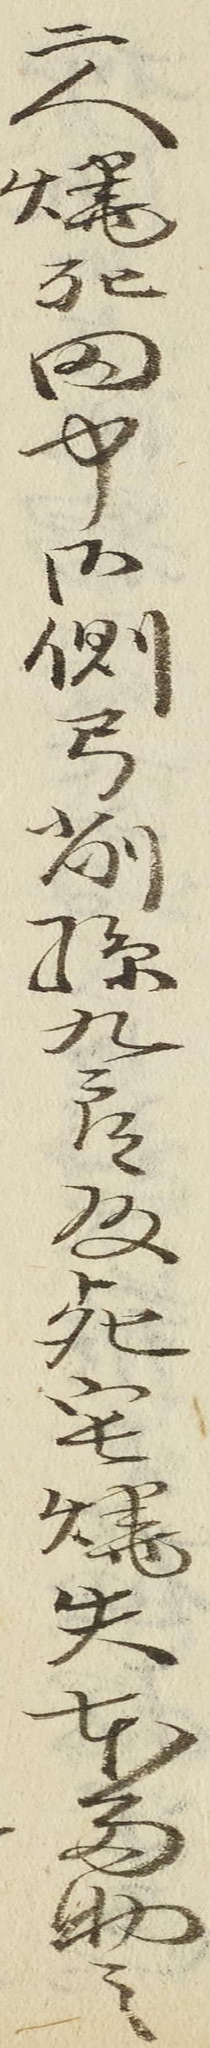二人焼死田中御側弓削孫九郎殿死宅焼失本多助之
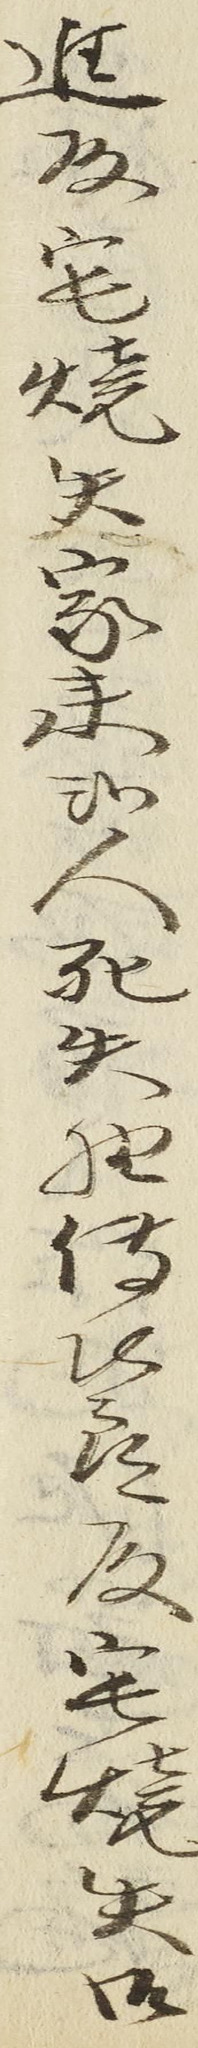進殿宅焼失家来弐人死失袖伝次郎殿宅焼失御
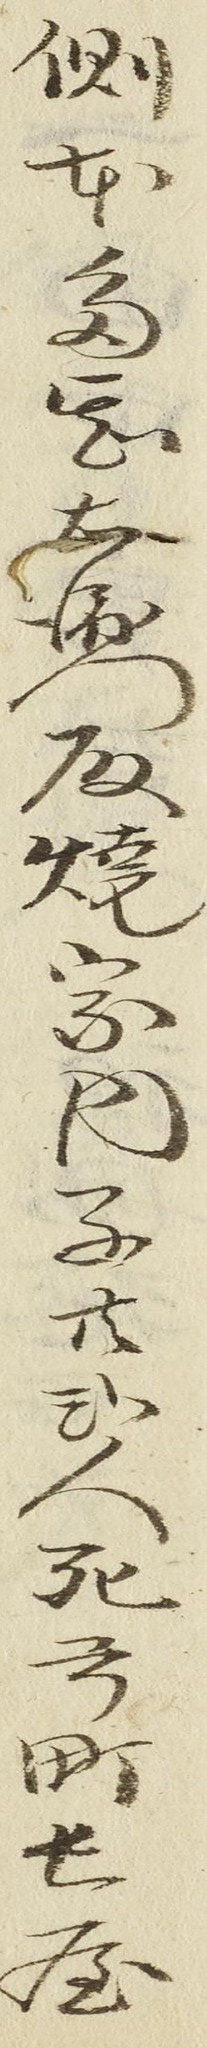側本多勘左衛門殿焼家内子供弐人死弓町長屋
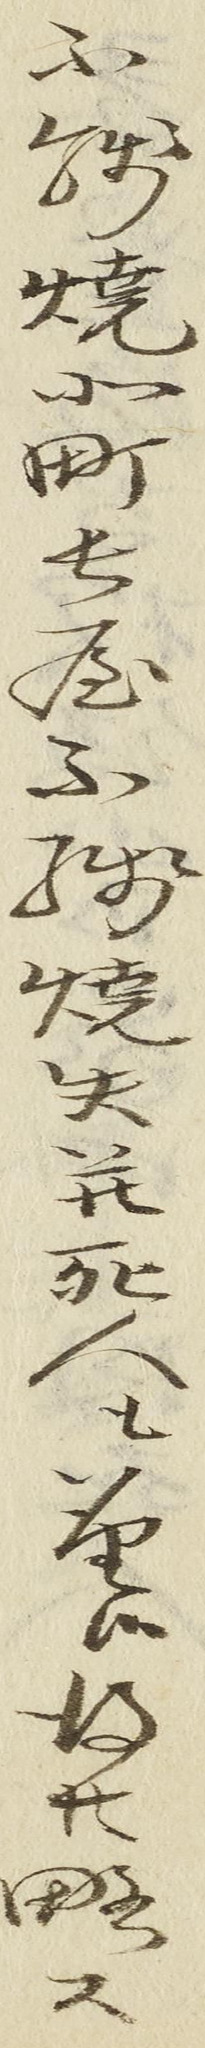不残焼北町長屋不残焼失并死人も御座候得共略ㇲ
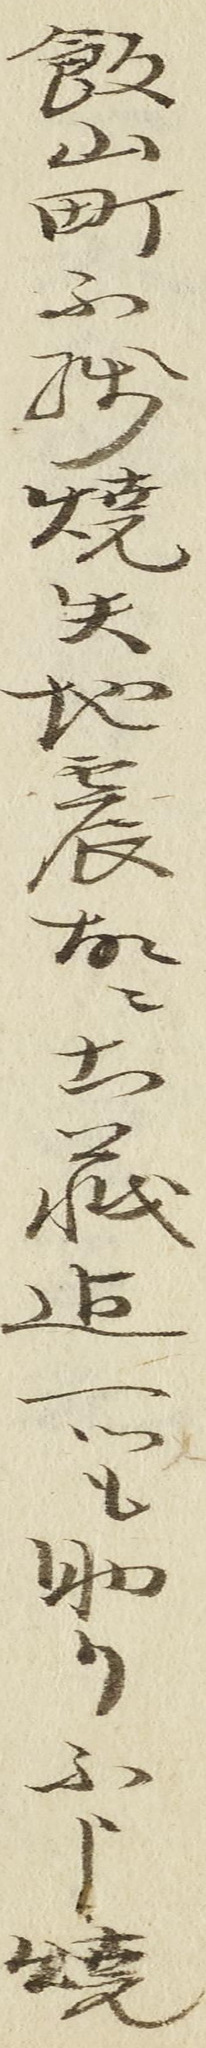飯山町屋不残焼失地震故二土蔵迄一ッも助り不申焼
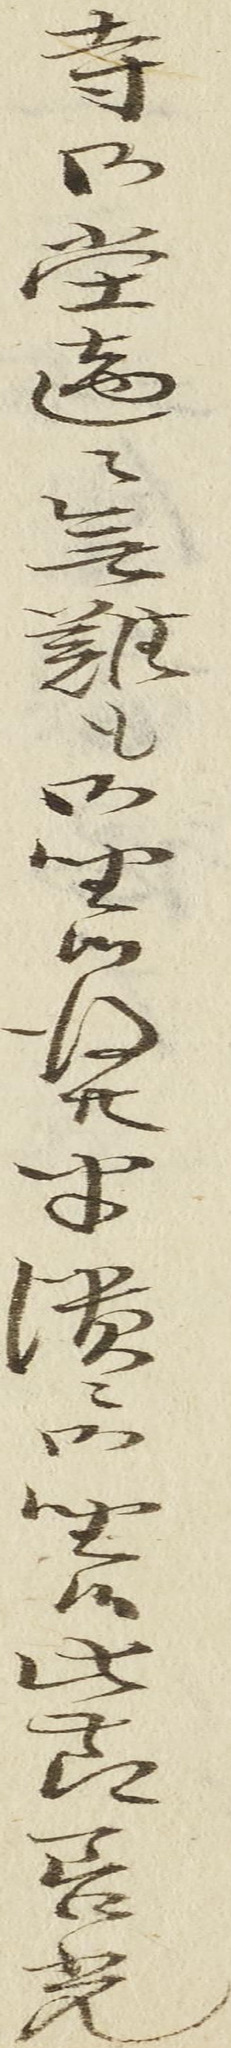寺々御堂適々無難も御坐候得共半潰二御坐候此節善光
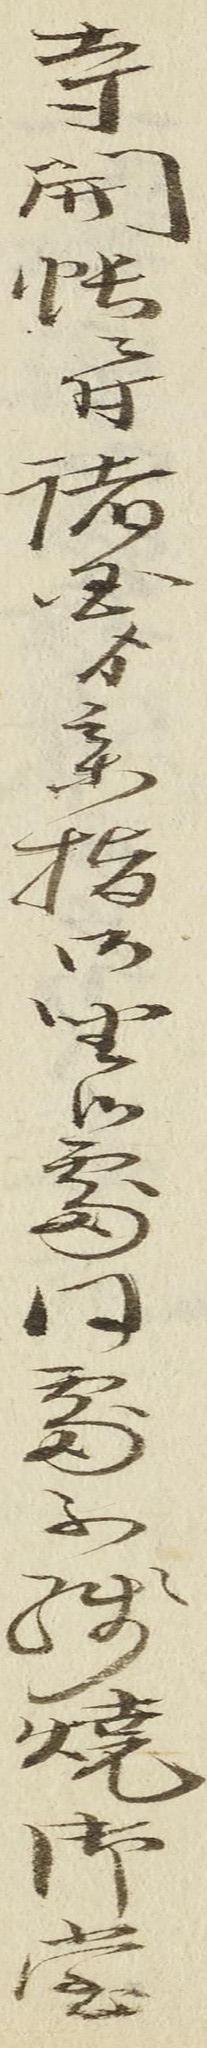寺開帳二付諸国ゟ参詣御坐候処同処不残焼御堂
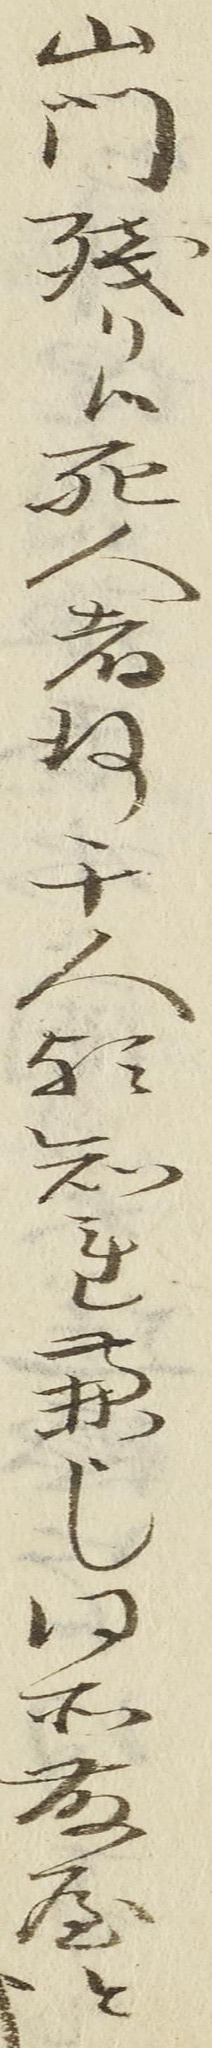山門残り死人は何千人歟不知れ兼申候同所藤屋と申
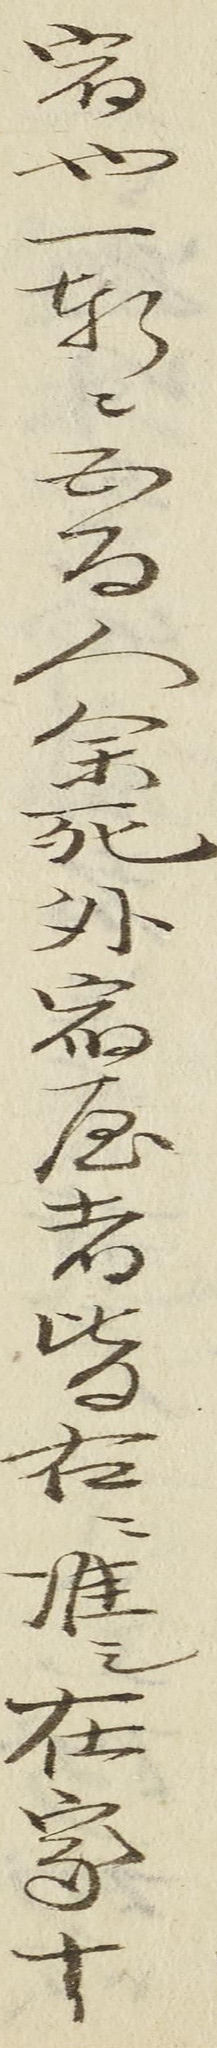宿や一軒二五百人余死外宿屋は皆右二準ㇱ在家十
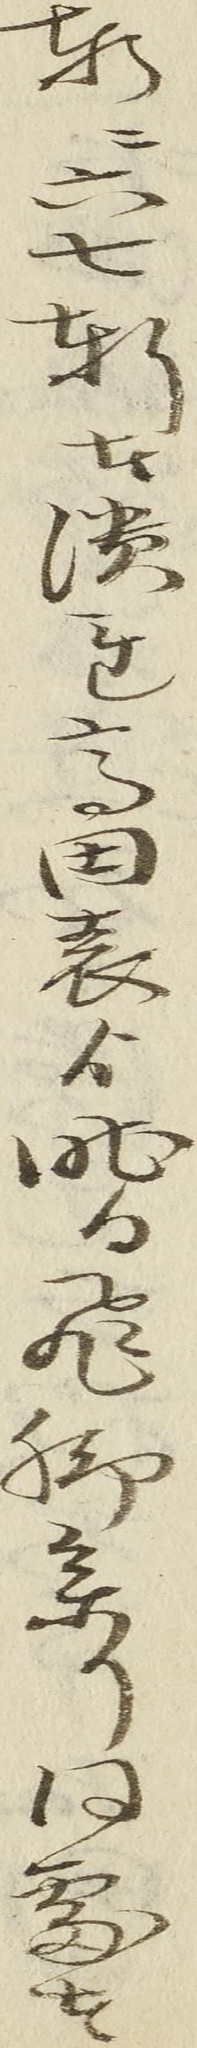軒二六七軒は潰れ高田表ゟ昨日飛脚参り同処は
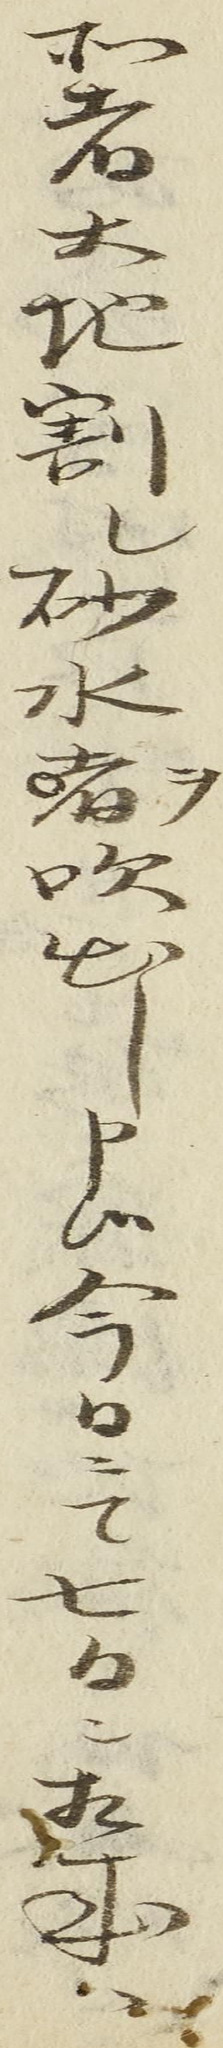所は大地割ㇾ砂水ヲ吹出し申候今日二而七日二相成候
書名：信濃國大地震記　乾
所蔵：東京大学地震研究所図書室 Earthquake Research Institute Library, The University of Tokyo, JAPAN
